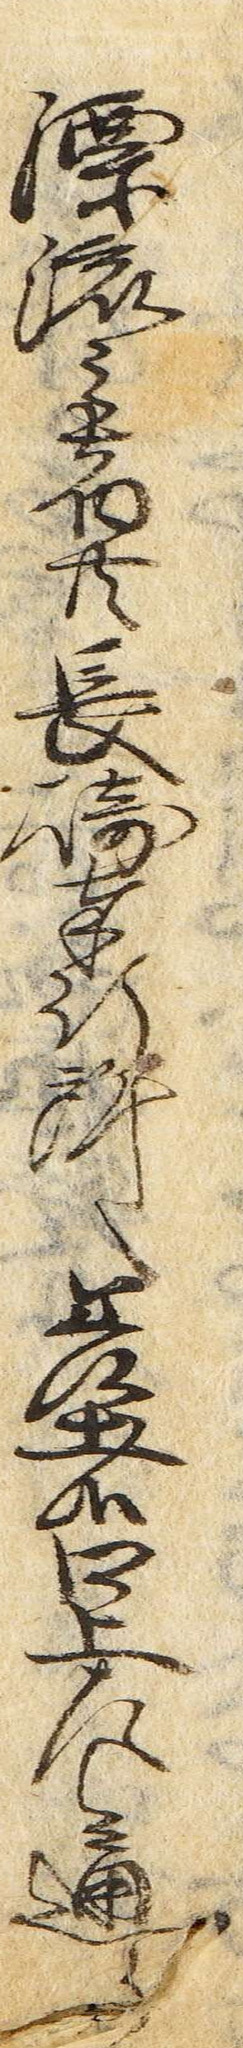一漂流之者共長崎奉行所へ差出候口上左之通り
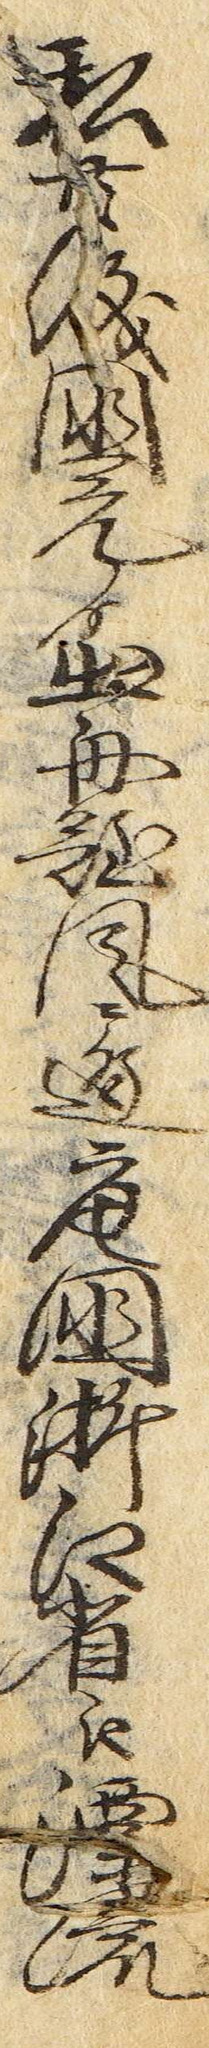私共儀国元ゟ出舟難風ニ逢唐国浙江省江漂流
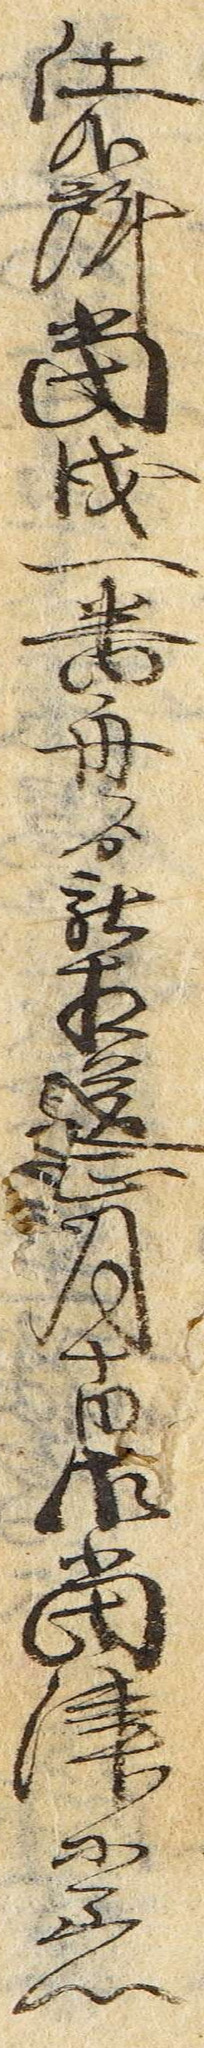仕候所当戌一番舟ゟ被相送正月十日御当津に着

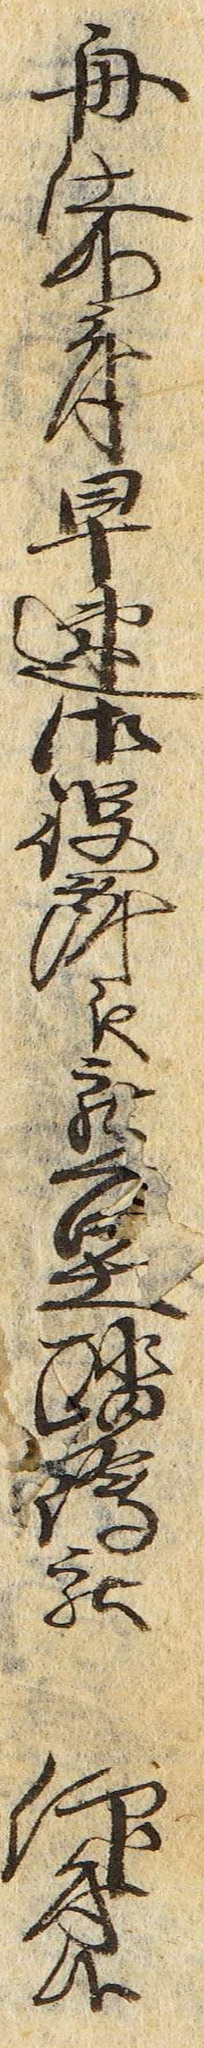舟仕候ニ付早速御役所江被召出踏絵被仰付候
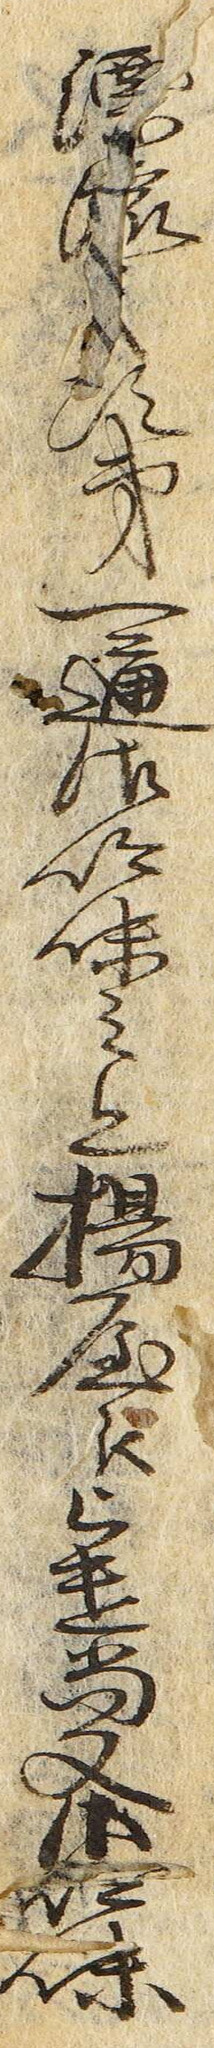漂流之次第一通御吟味之上揚屋江被遣尚又御吟味
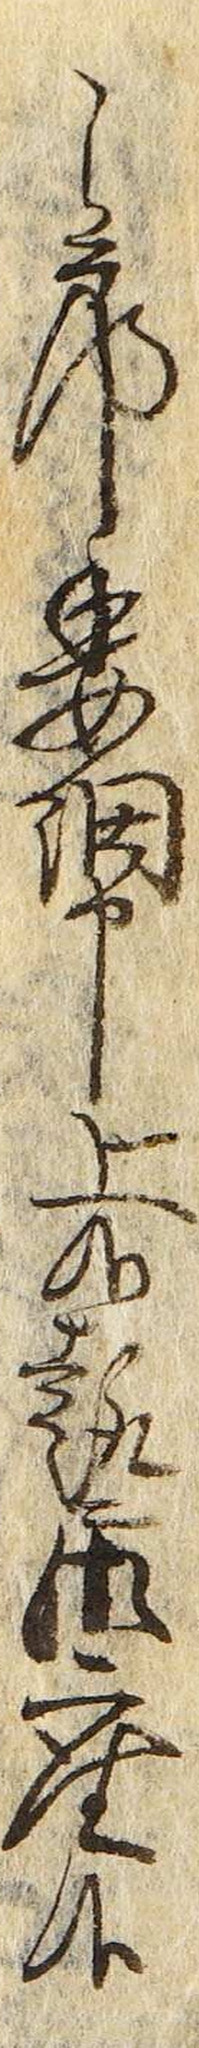之節委細申上候趣ニ御座候
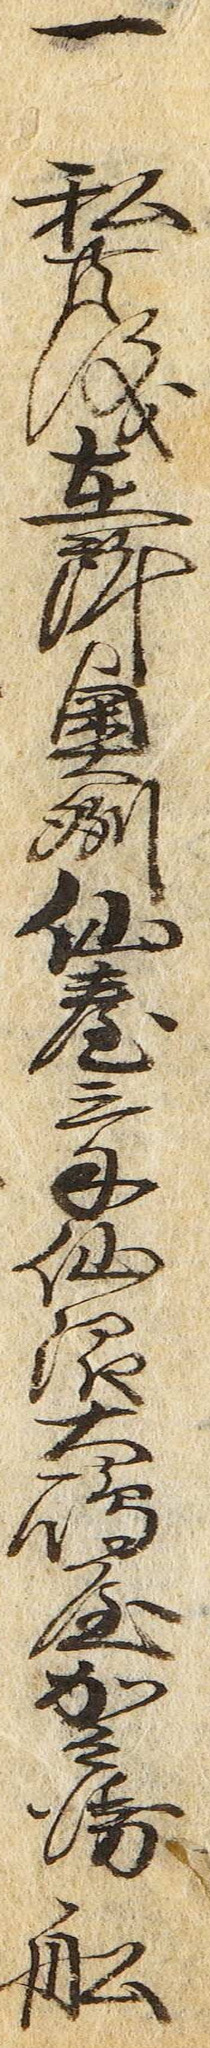一私共儀在所奥州仙台気仙沼大島屋加兵衛船
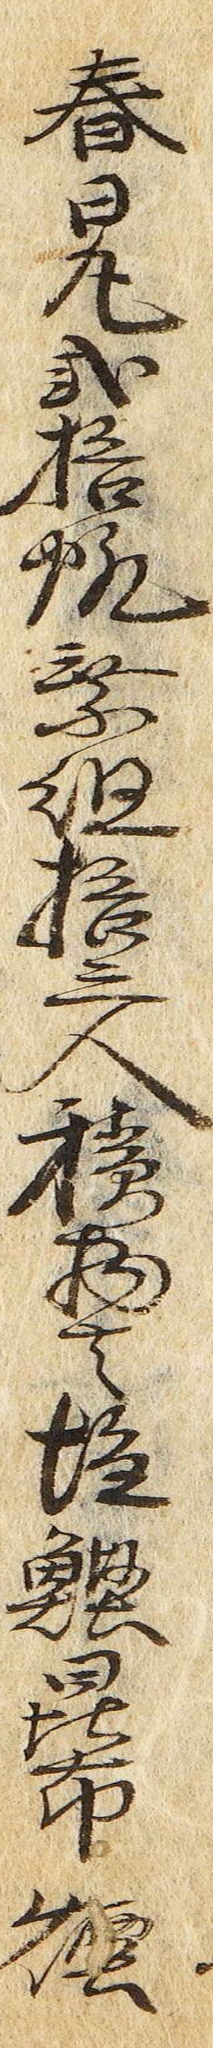春日丸弐拾帆乗組拾三人積物は塩鰹昆布煙
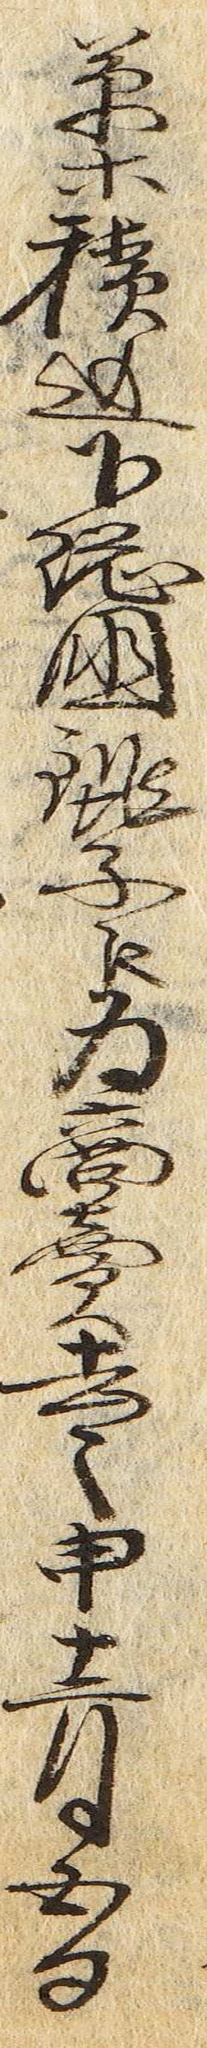草等積込下総国銚子江為商売去々申十二月五日
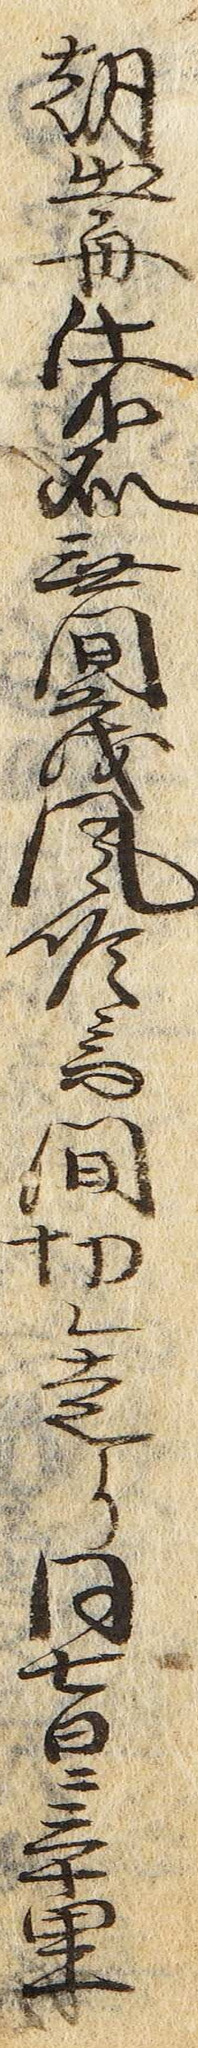朝出舟仕候処無間も風順ニ而間切レ走り同七日ニ三十里
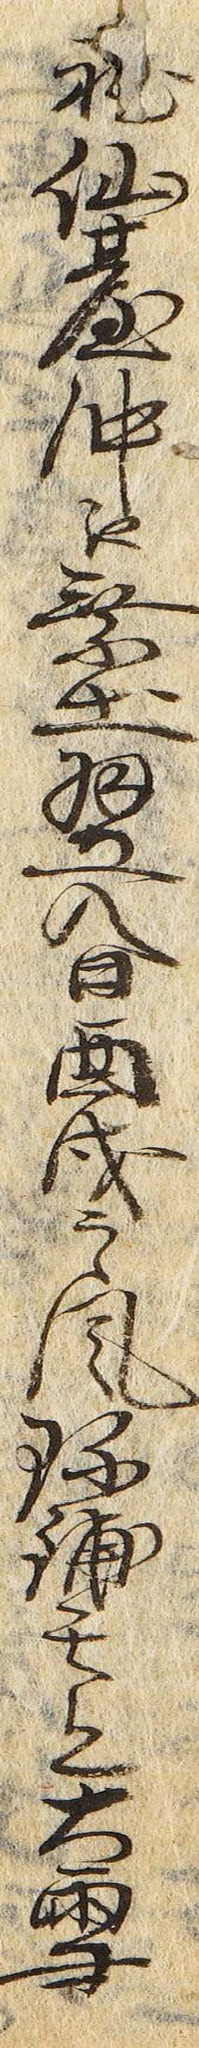程仙台沖江乗出翌八日酉戌之風珍鋪其上大雪
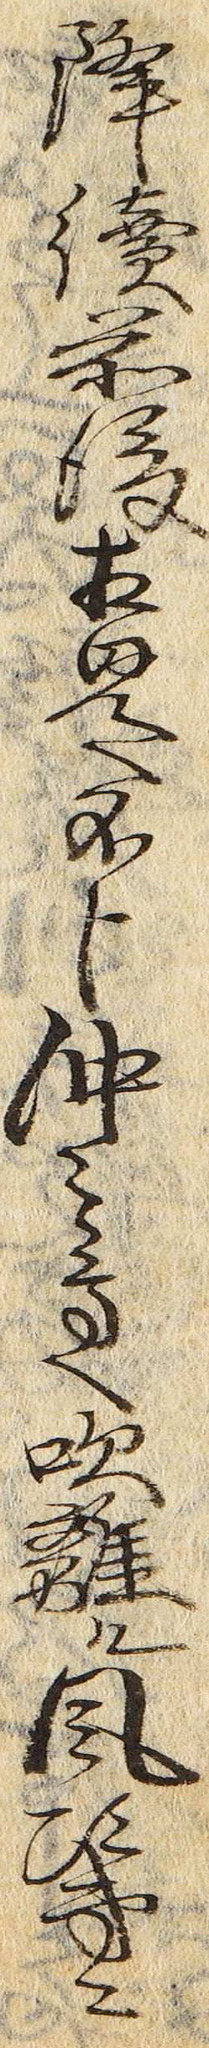降続前後相見へ不申沖之方へ吹離れ風次第ニ
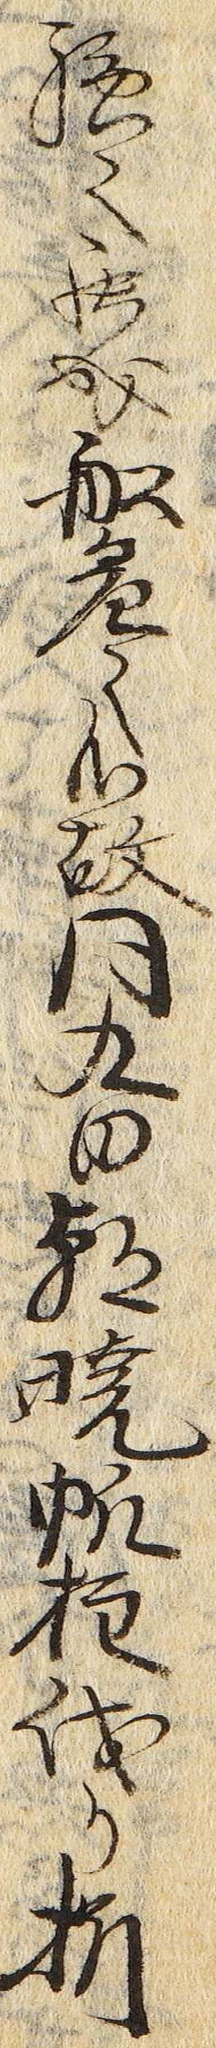強く罷成船危く候故同九日朝暁帆柱伐り折
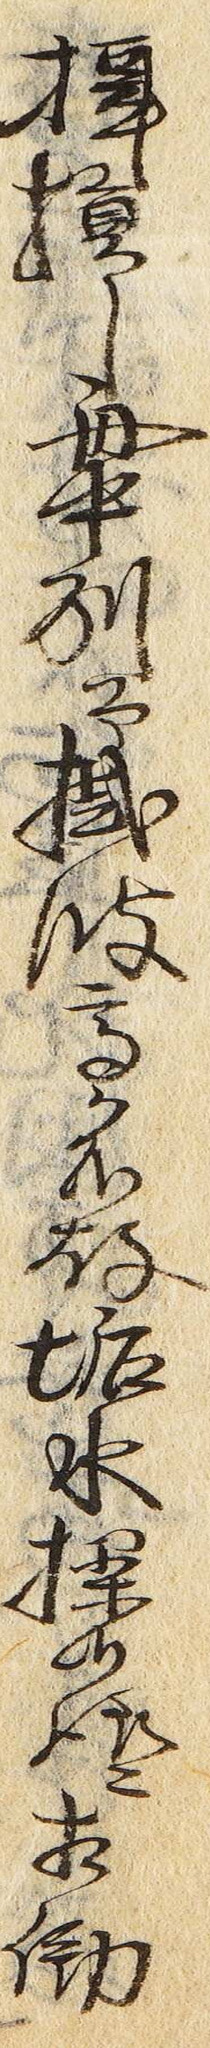楫損し舟中別而掛波高ク候故垢水操候様ニ相働
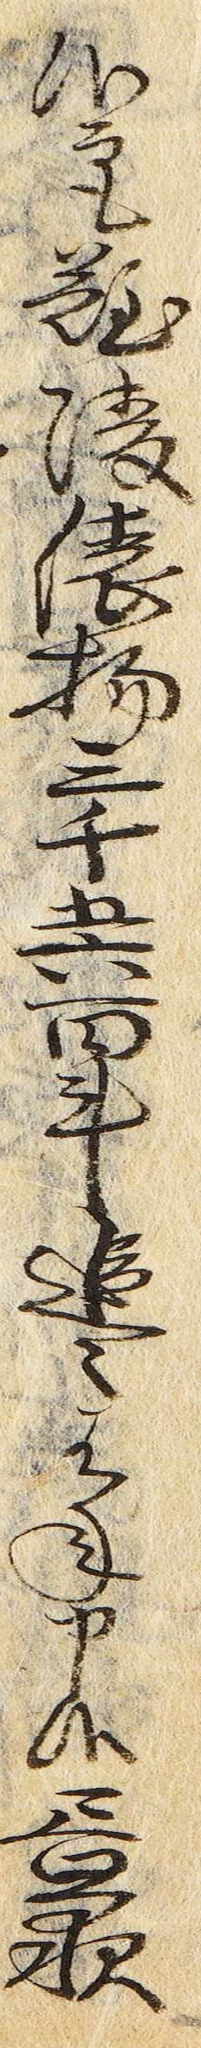候而も難凌俵物三千五六百斗追々はね申候昼夜
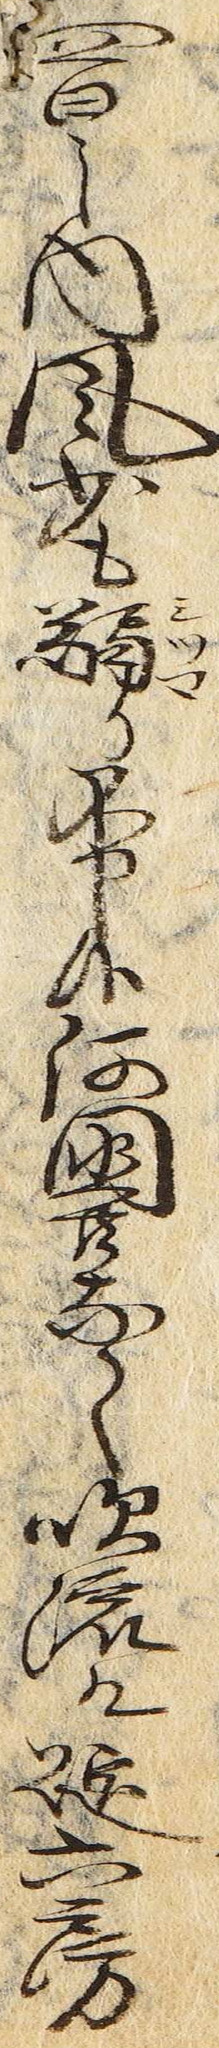四日之内風少も弱り不申候何国共なく吹流れ碇六房
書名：奥州仙台領之者唐国江漂流一件
